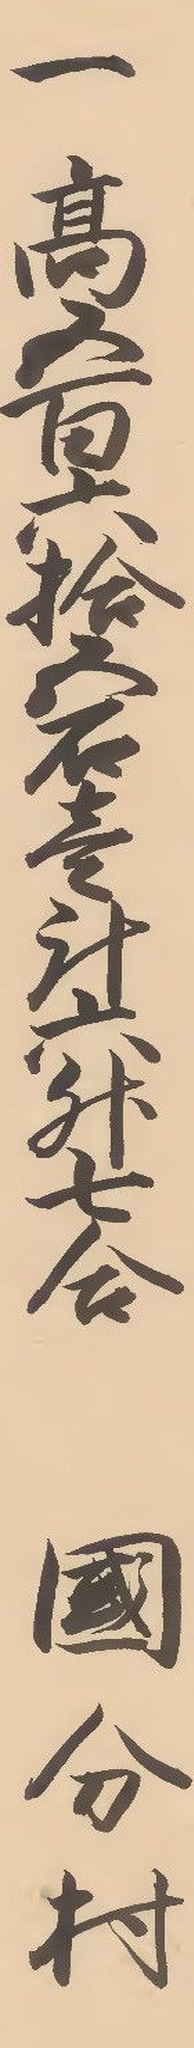一高五百六拾五石壱斗六升七合国分村
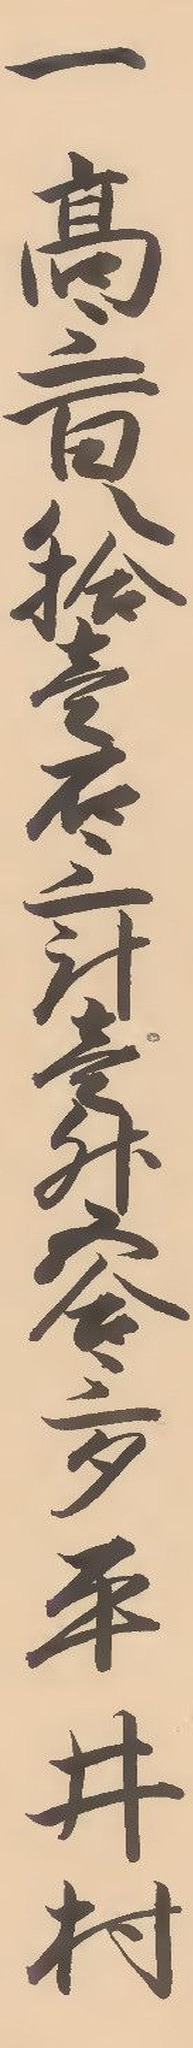一高三百八拾壱石三斗壱升五合三勺平井村

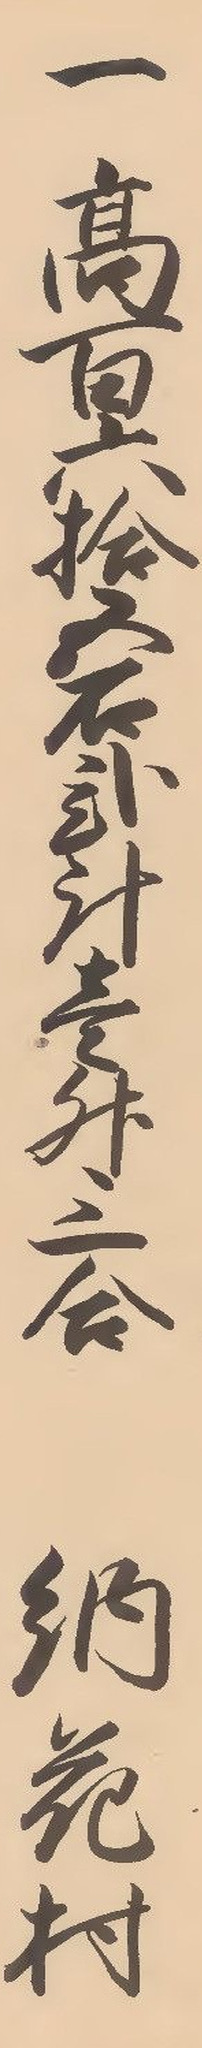一高百六拾五石弐斗壱升三合納花村
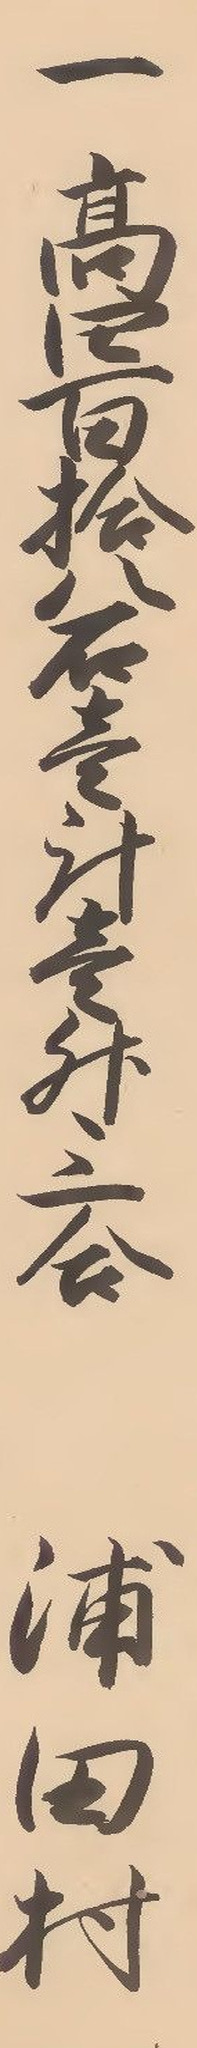一高四百拾八石壱斗壱升三合浦田村
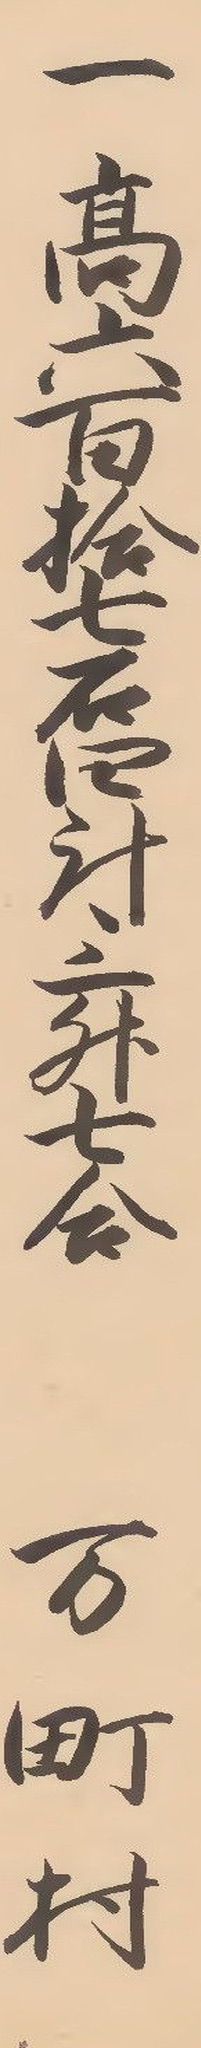一高六百拾七石四斗三升七合万町村
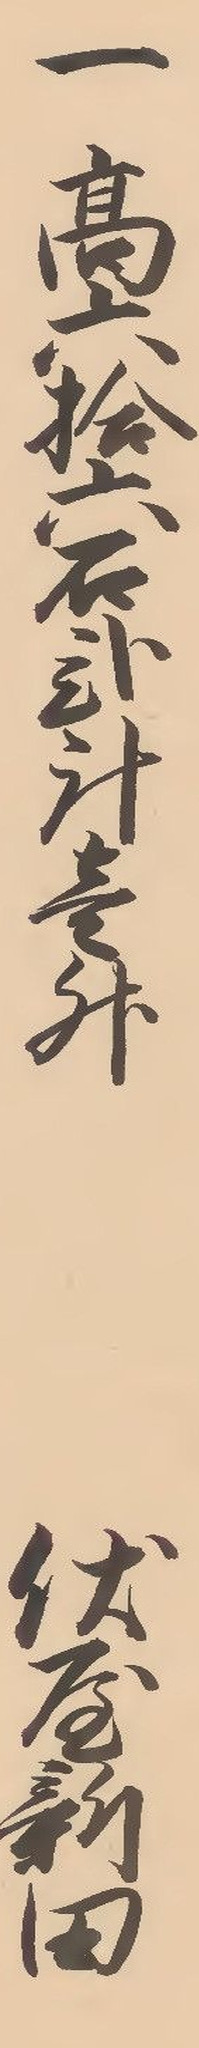一高六拾六石弐斗壱升伏屋新田
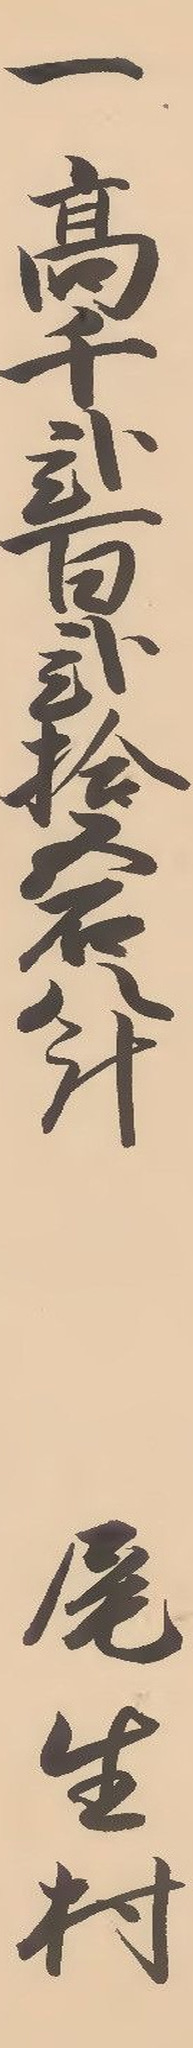一高千弐百弐拾五石八斗尾生村
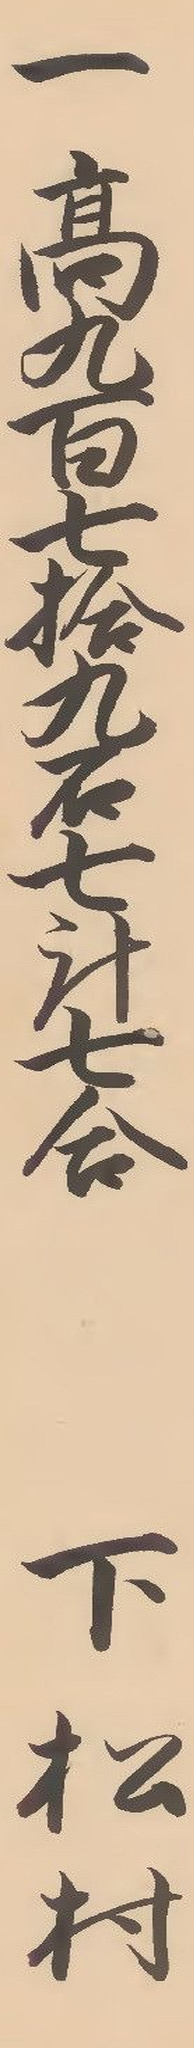一高九百七拾九石七斗七合下松村

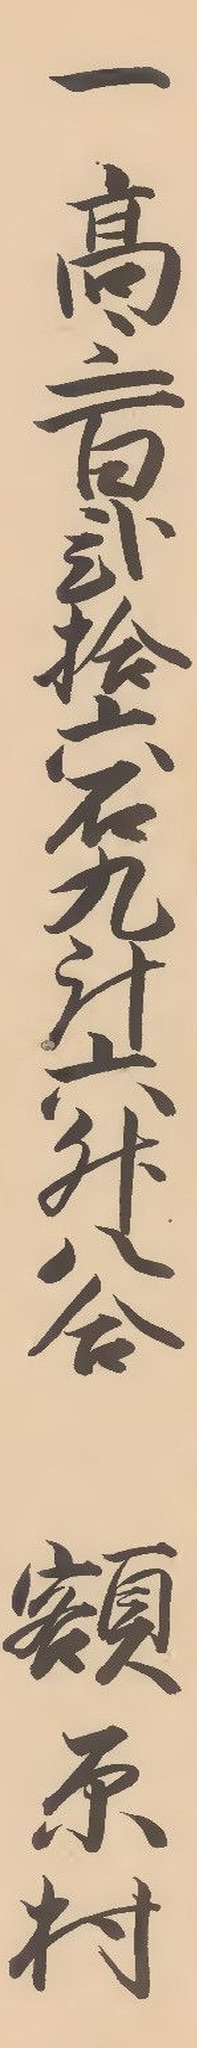一高三百弐拾六石九斗六升八合額原村
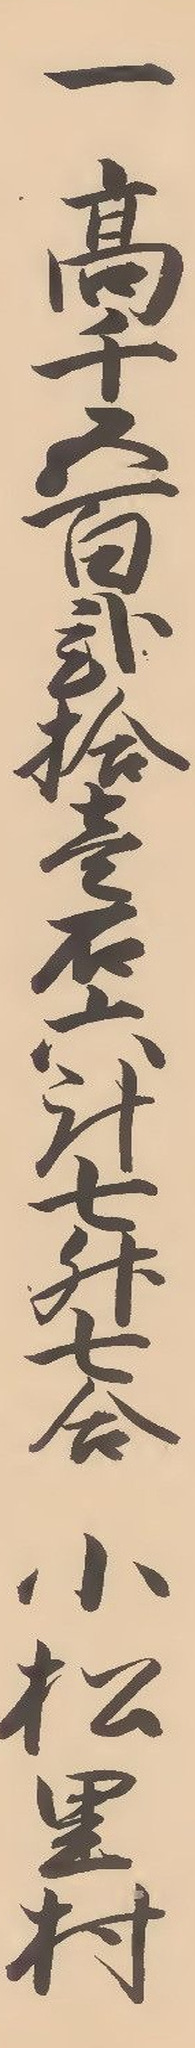一高千五百弐拾壱石六斗七升七合小松里村
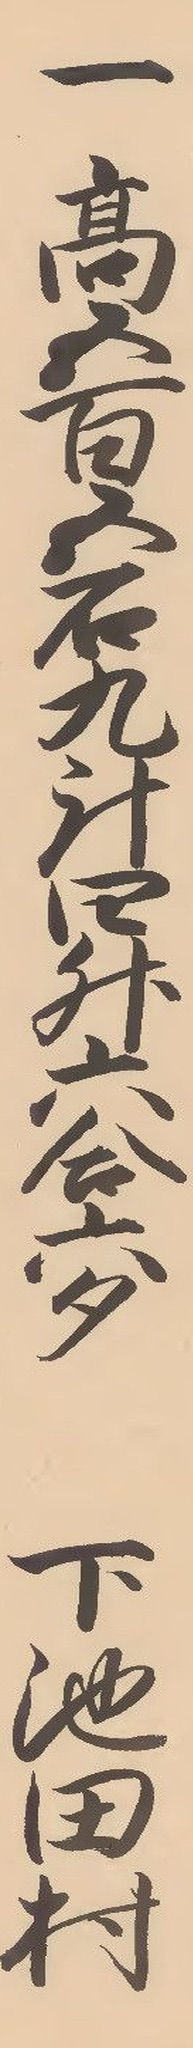一高五百五石九斗四升六合六勺下池田村
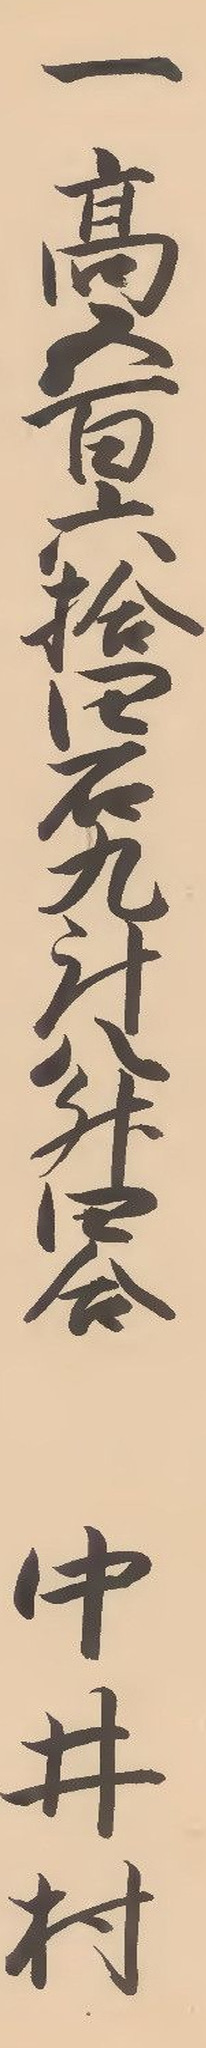一高五百六拾四石九斗八升四合中井村
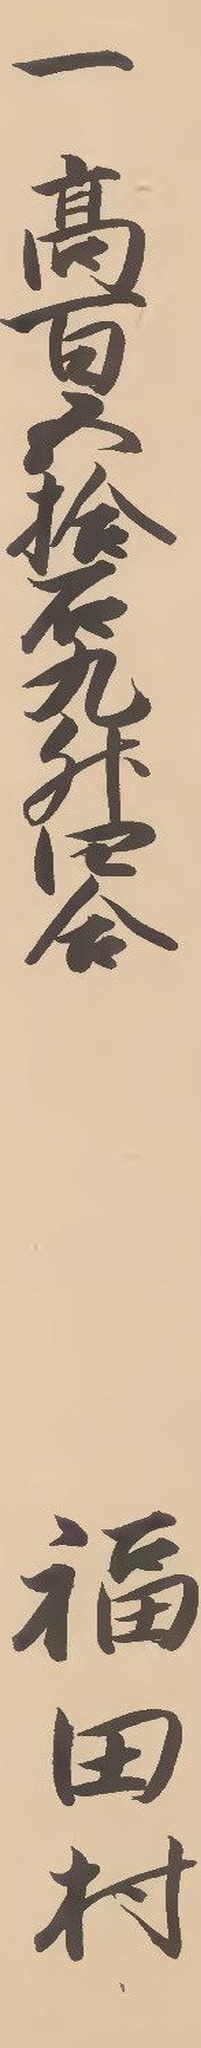一高百五拾石九升四合福田村
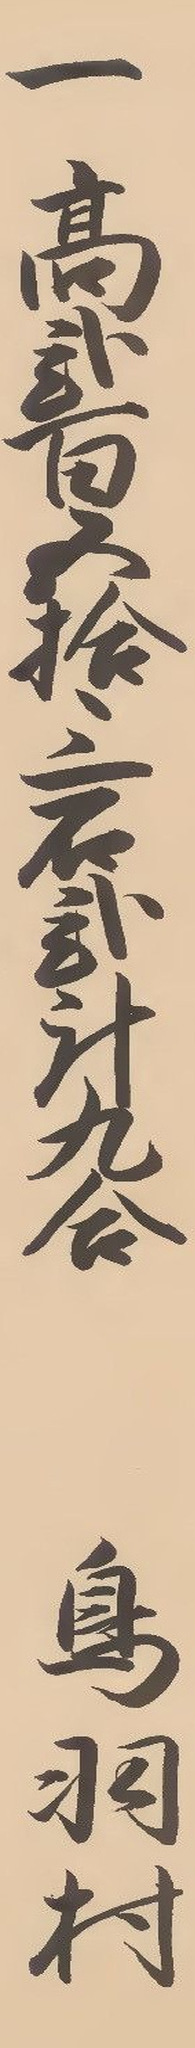一高弐百五拾三石弐斗九合鳥羽村
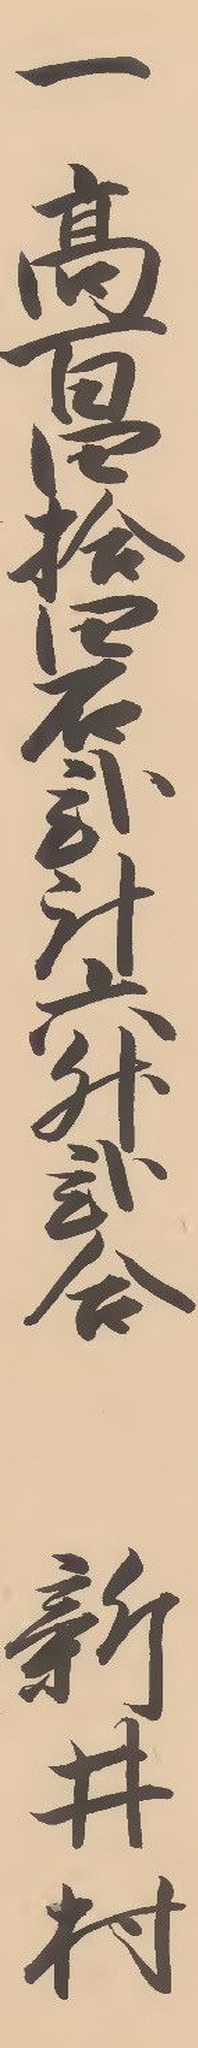一高百四拾四石弐斗六升弐合新井村
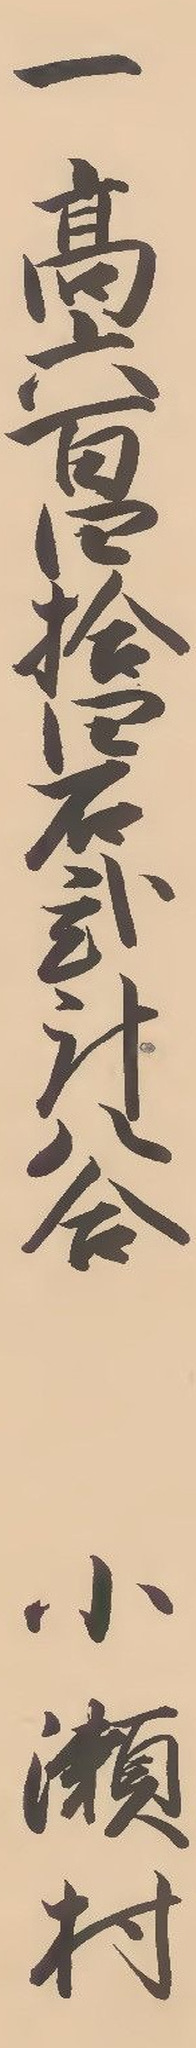一高六百四拾四石弐斗八合小瀬村
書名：和泉国郷帳
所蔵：国立公文書館 National Archives of Japan
